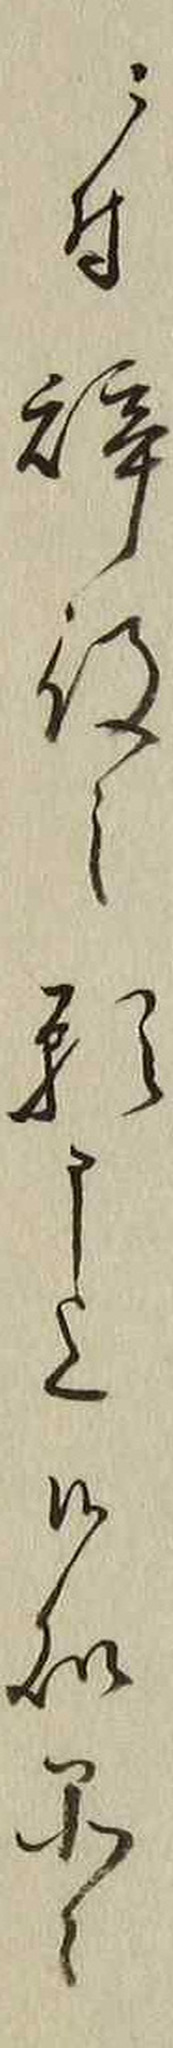に付辞役之願申上候処品々
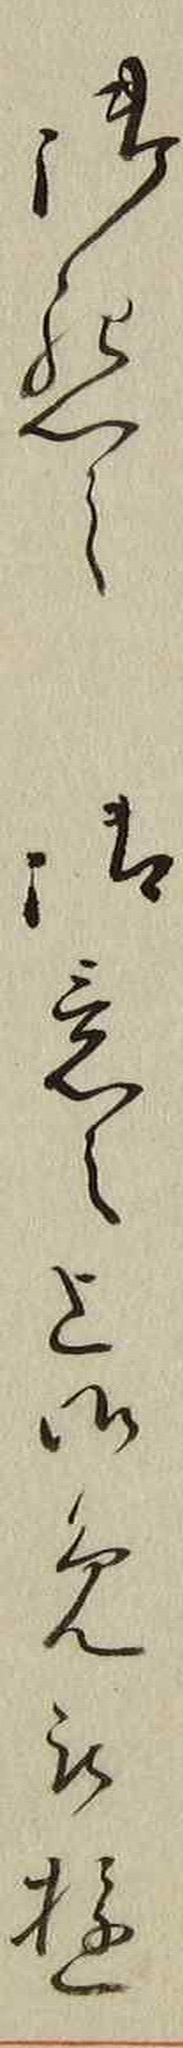御懇之御意之上御免被遊
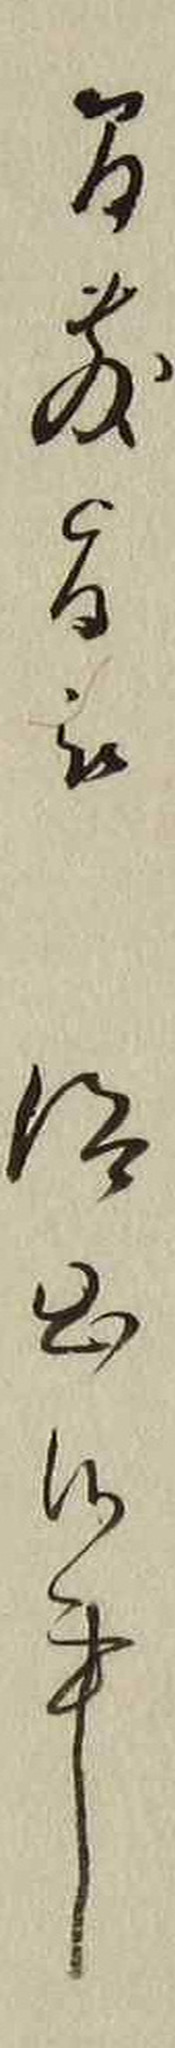間敷旨被仰出候事
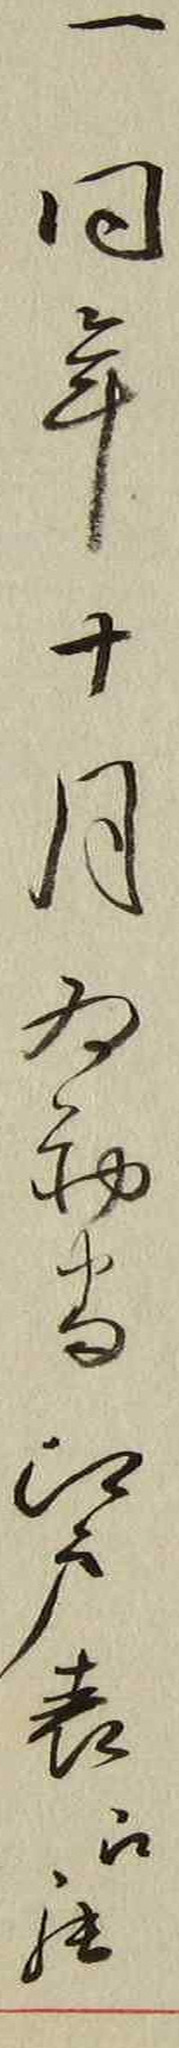一同年十月為勤番江戸表江罷
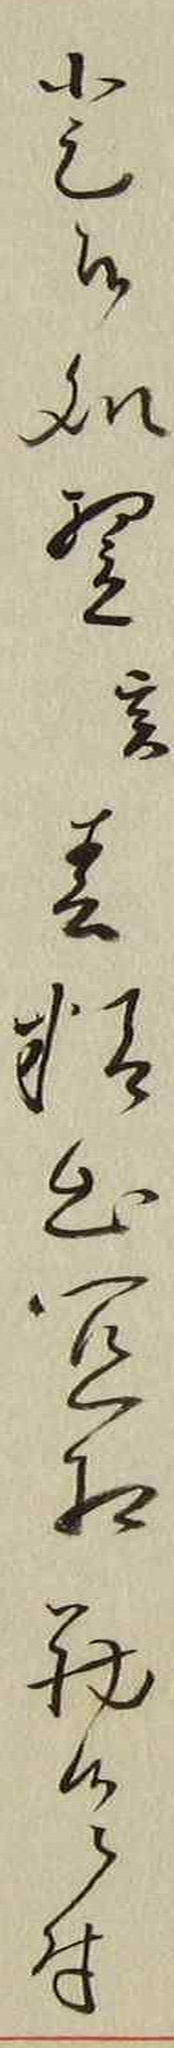登候処翌亥春精出宜相勤候に付
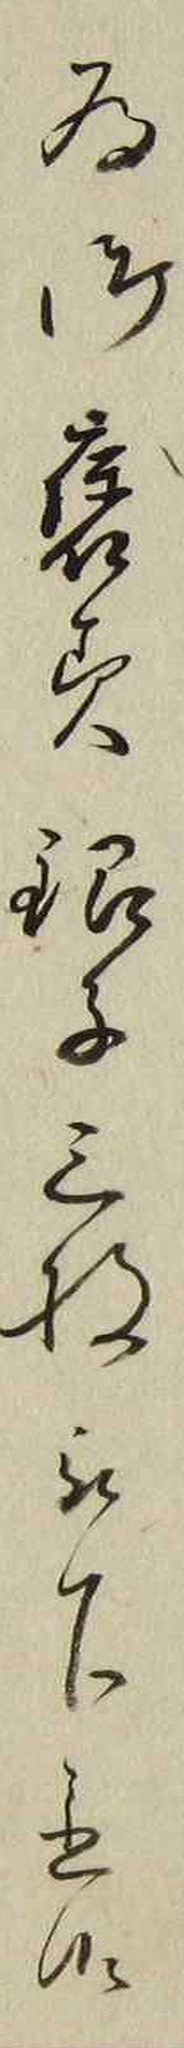為御褒美銀子三枚被下置御
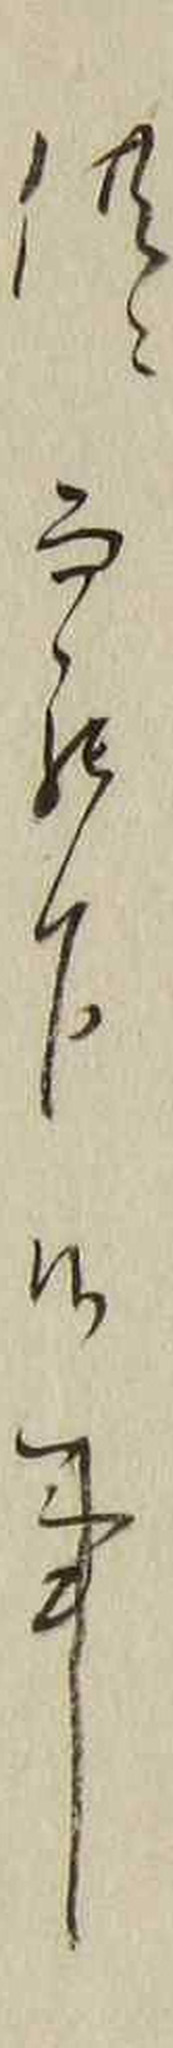供に而罷下候事

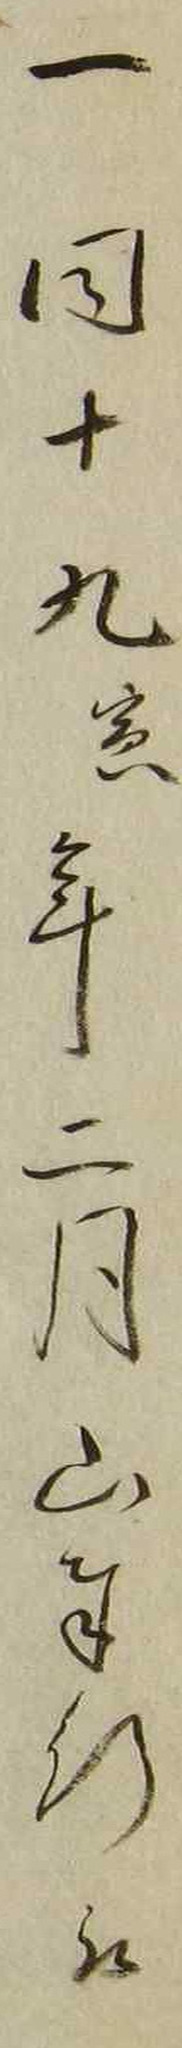一同十九寅年二月山奉行被
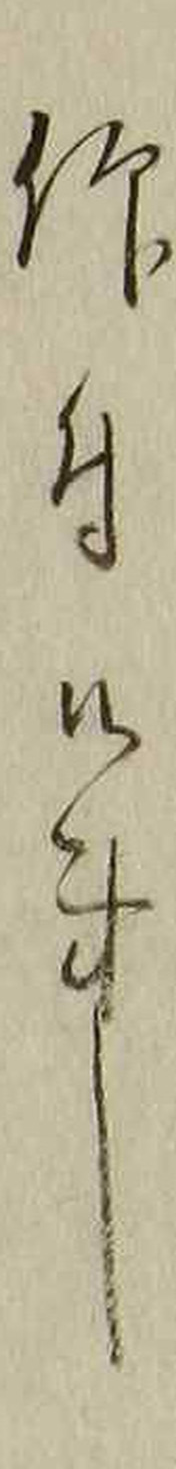仰付候事
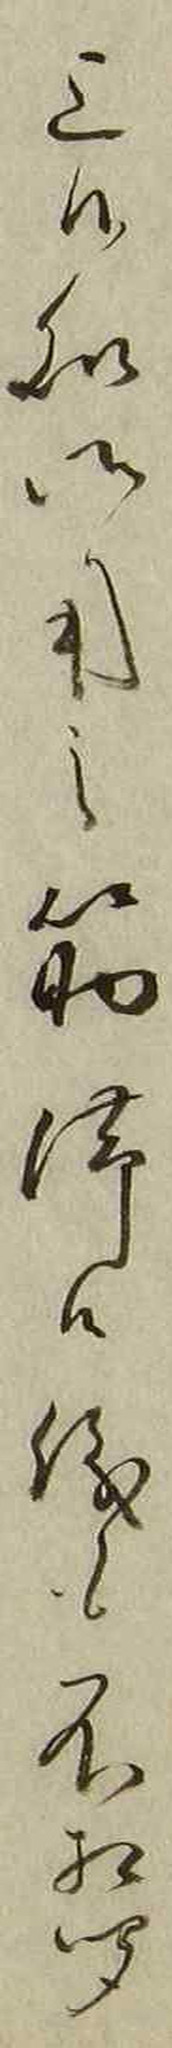上候処御用之筋滞候儀も不相聞
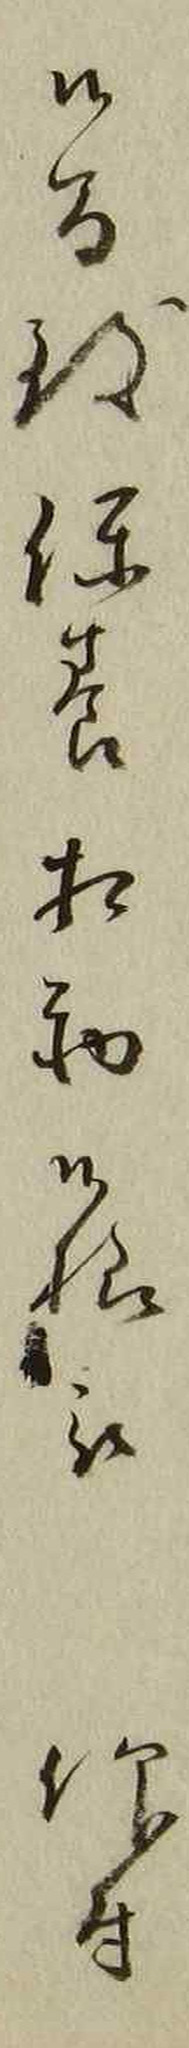候間致保養相勤候様被仰付
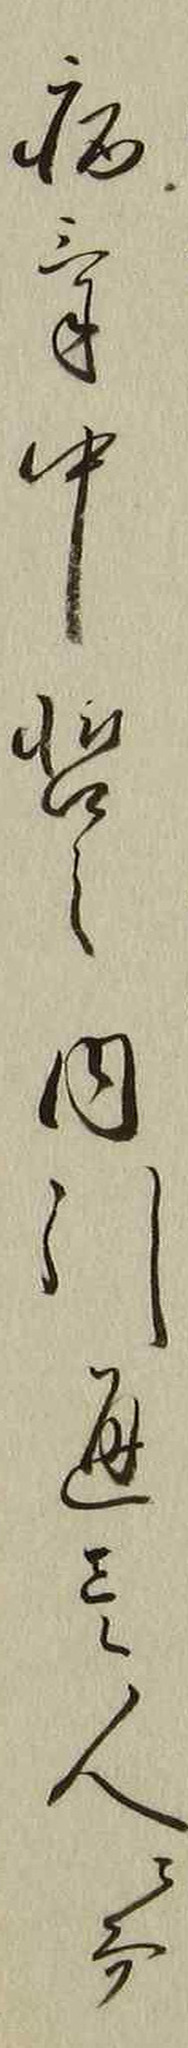病気中暫之内引通壱人に而
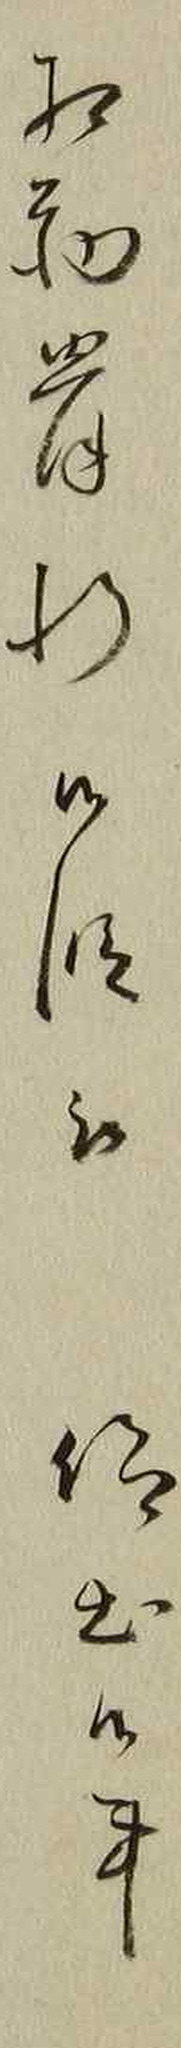相勤骨折候段被仰出候事
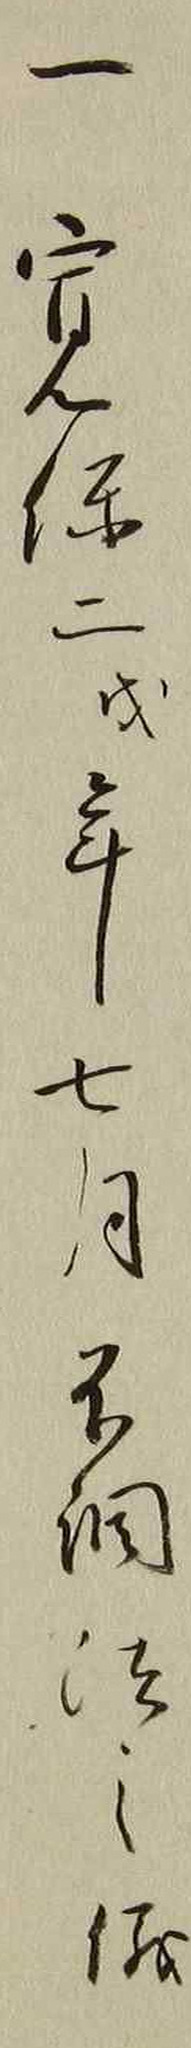一寛保ニ戌年七月不調法之儀
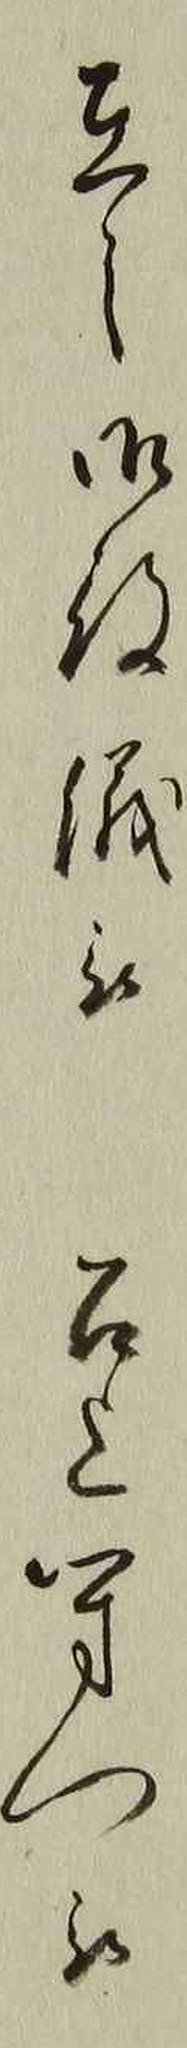在之御役儀被召上閉門被
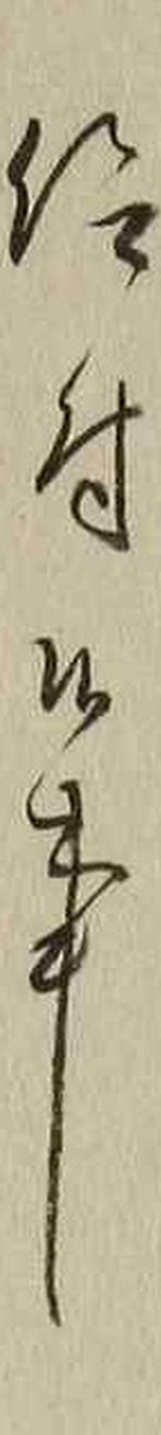仰付候事
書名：諸士系譜　巻之6　い之部6
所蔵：会津若松市立会津図書館
